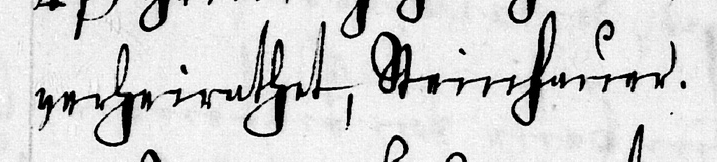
verheirathet, Steinhauer.
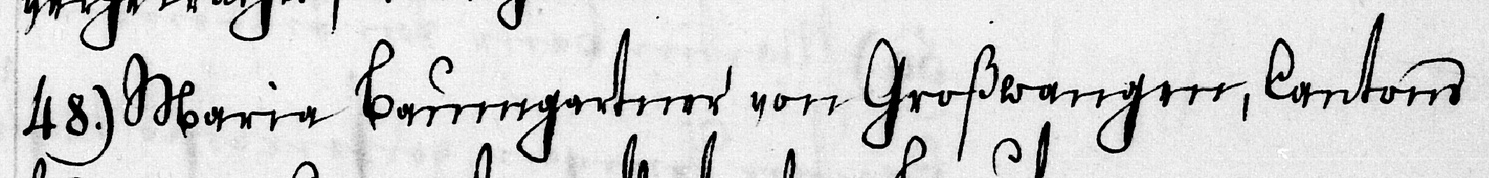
48.) Maria Baumgartner von Großwangen, Cantons
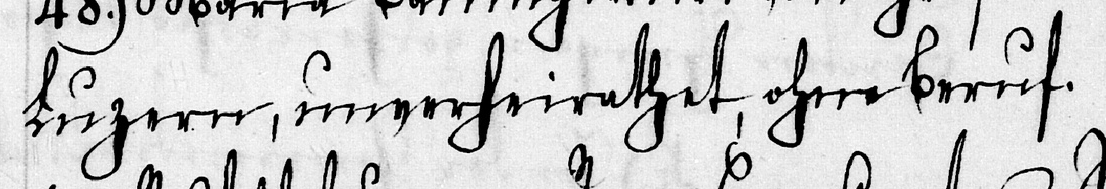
Luzern, unverheirathet, ohne Beruf.
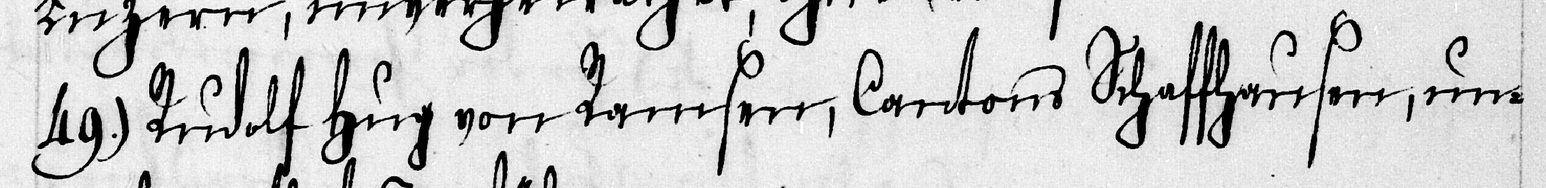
49.) Rudolf Hug von Ramsen, Cantons Schaffhausen, un¬
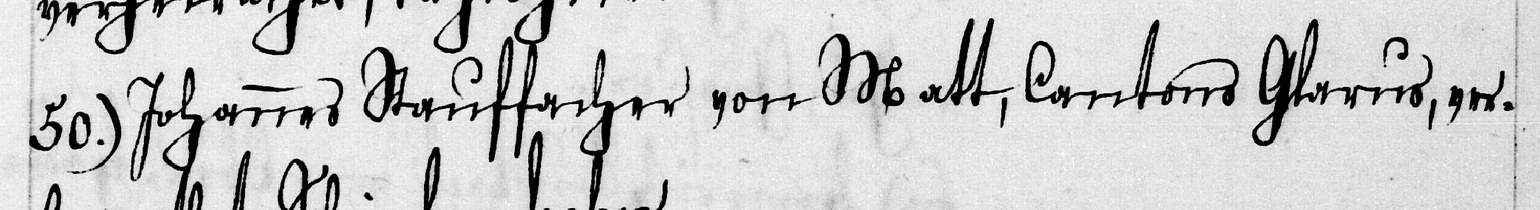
50.) Johannes Stauffacher von Matt, Cantons Glarus, ver¬
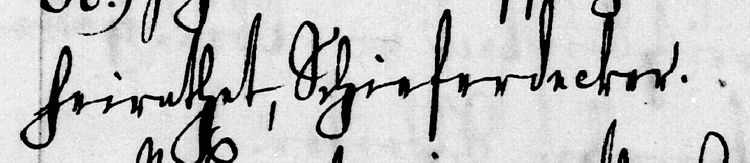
heirathet, Schieferdecker.
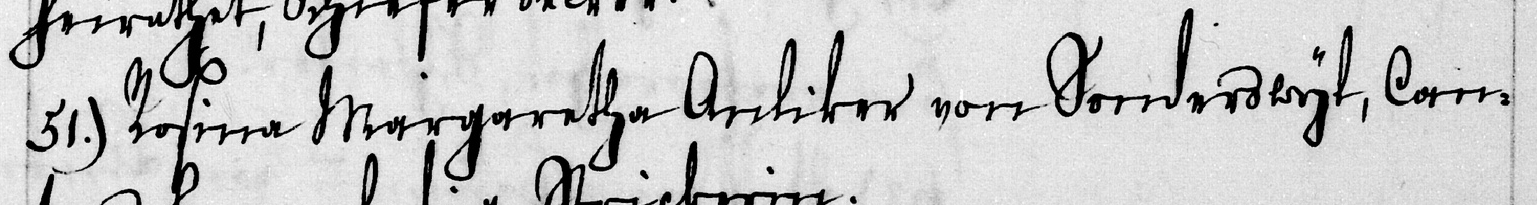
51.) Rosina Margaretha Anliker von Sonderswyl, Can¬
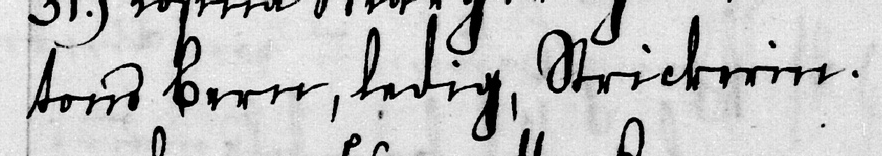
tons Bern, ledig, Strickerin.
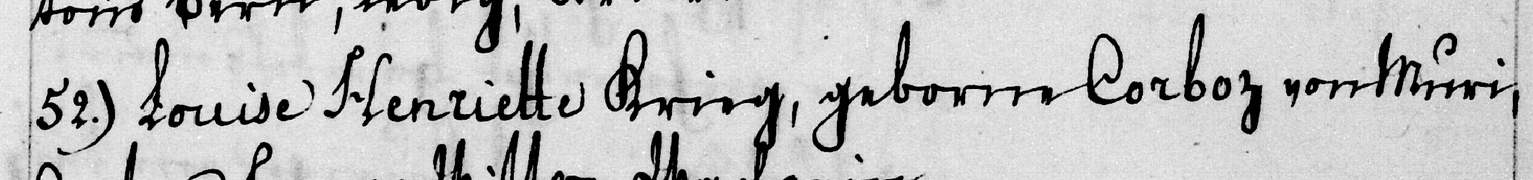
52.) Louise Henriette Krieg, geborne Corboz von Muri,
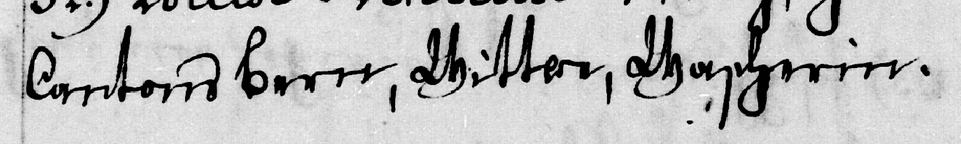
Cantons Bern, Wittwe, Wascherin.
